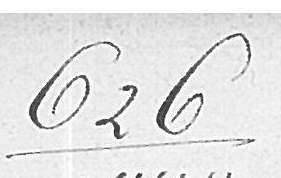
626
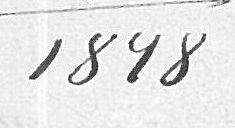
1848
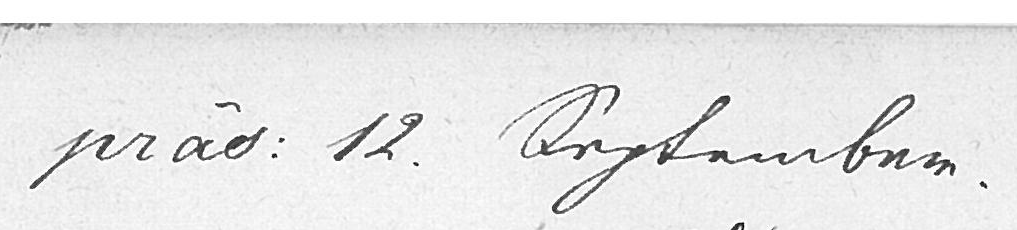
präs: 12. September.
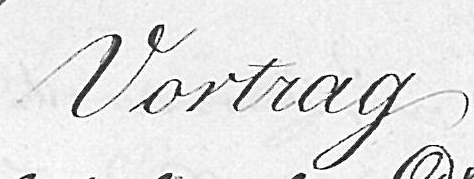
Vortrag
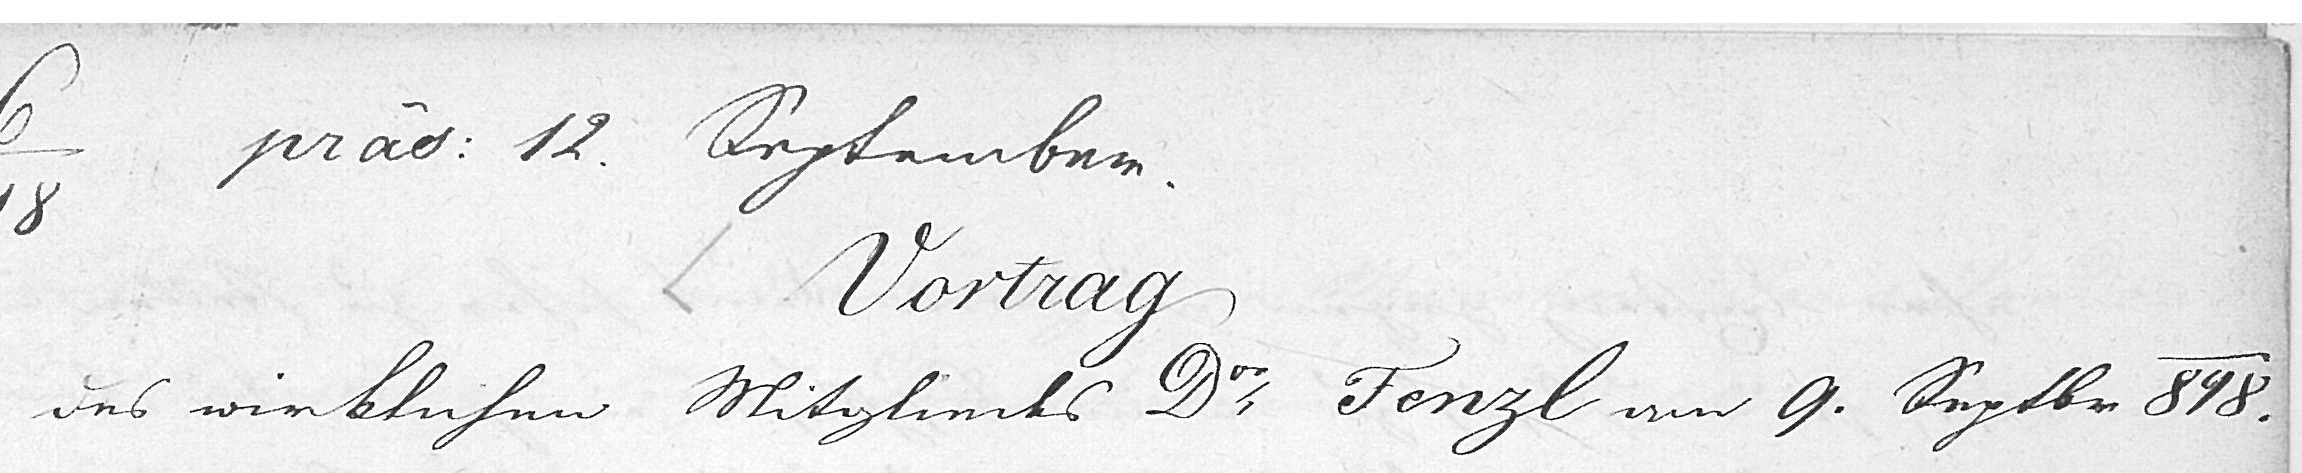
des wirklichen Mitgliedes Dr. Fenzl am 9. Septbr 848.
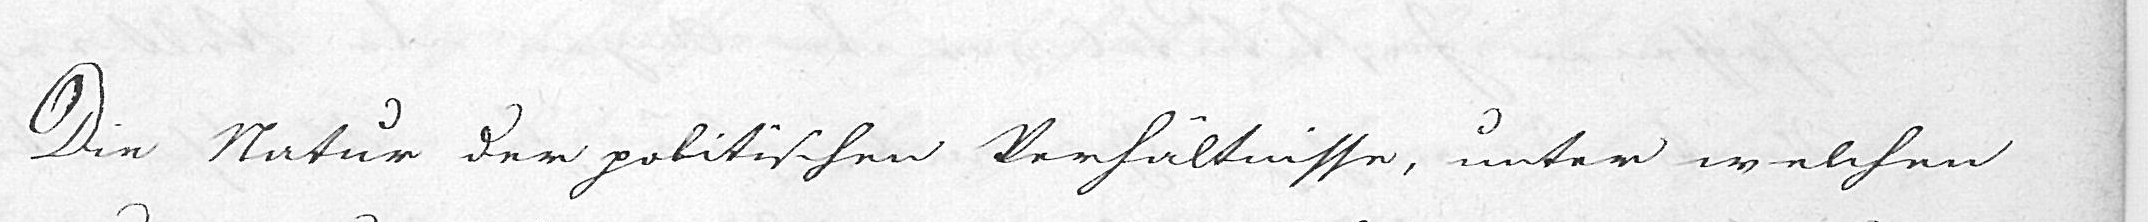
Die Natur der politischen Verhältnisse, unter welchen
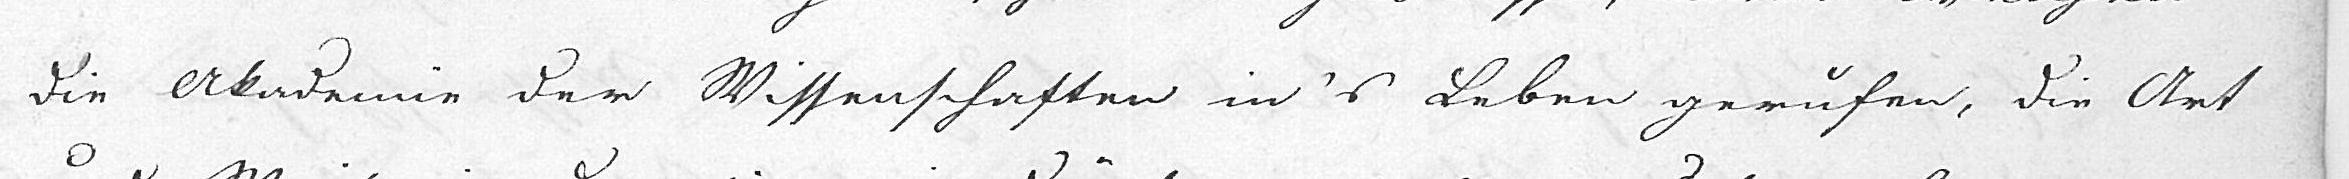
die Akademie der Wissenschaften in's Leben gerufen, die Art
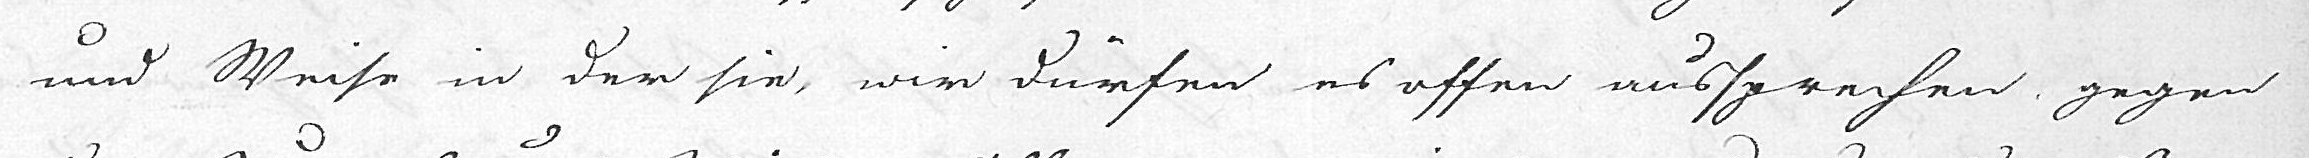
und Weise in der sie, wir dürfen es offen aussprechen, gegen
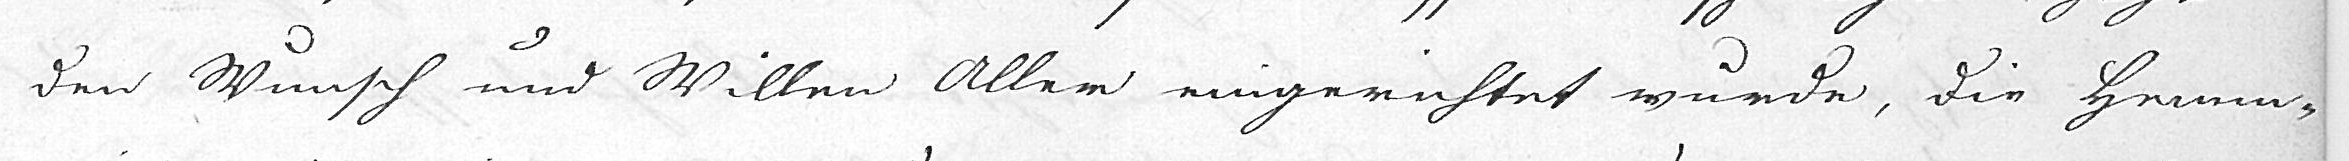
den Wunsch und Willen Aller eingerichtet wurde, die Hemm-
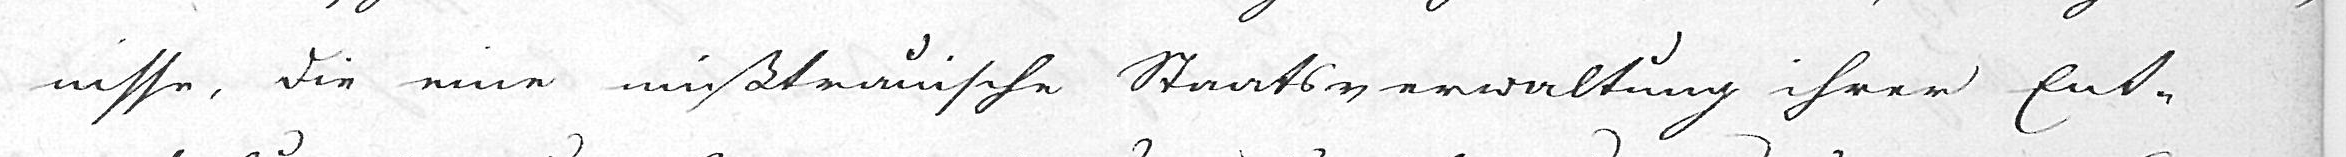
nisse, die eine mißtrauische Staatsverwaltung ihrer Ent-
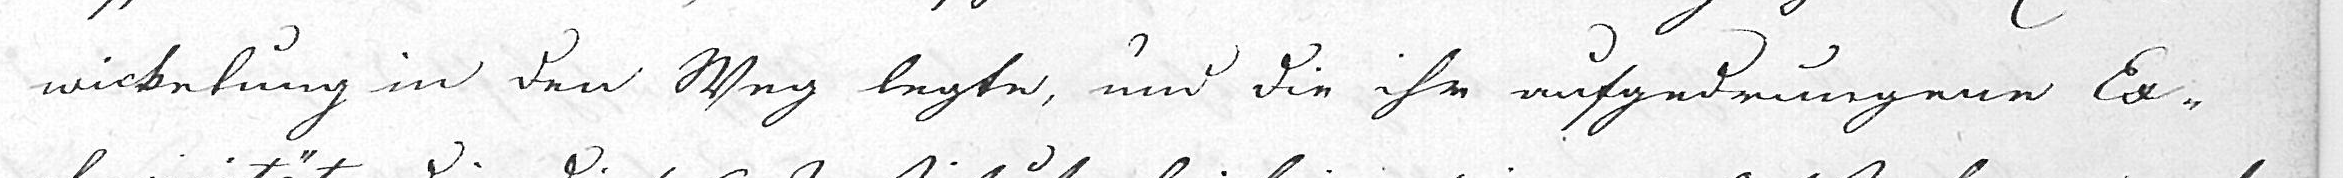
wickelung in den Weg legte, und die ihr aufgedrungene Ex-
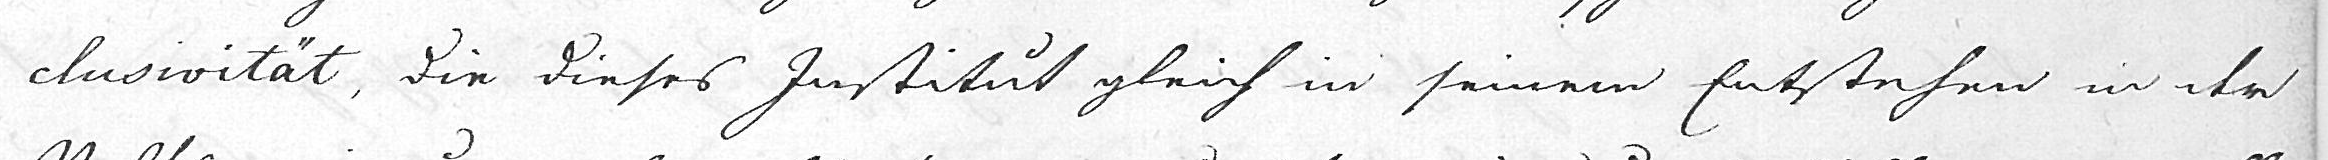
clusivität, die dieses Institut gleich in seinen Entstehen in der
